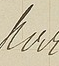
Herr
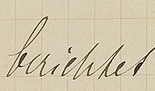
berichtet
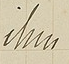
«Bulow
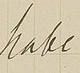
habe
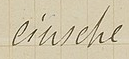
einsehe,
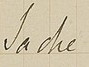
weitere
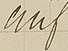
Sache
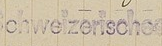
auf diese Weise wohl
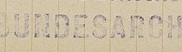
ehesten zu einer
